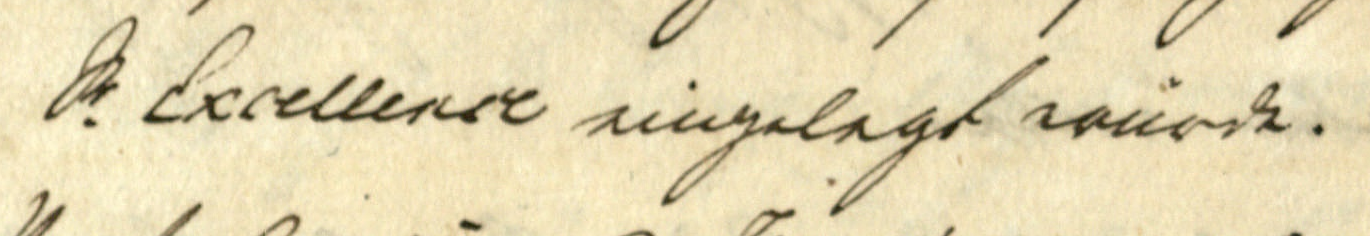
Sr Excellence eingelegt würde.
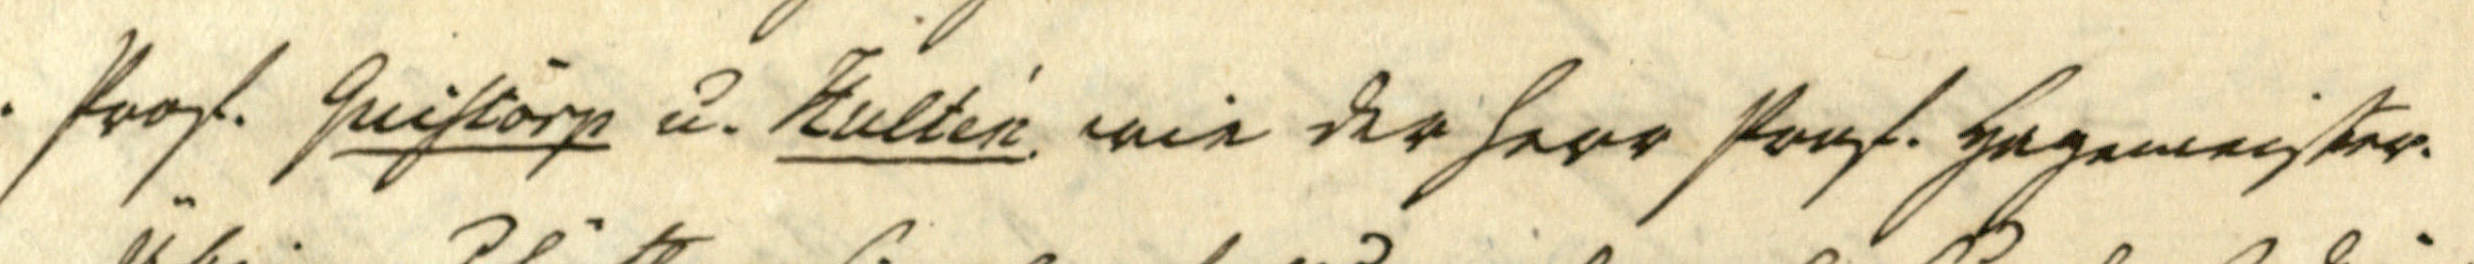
Prof. Quistorp. u. Hultén, wie der Herr Prof. Hagemeister.
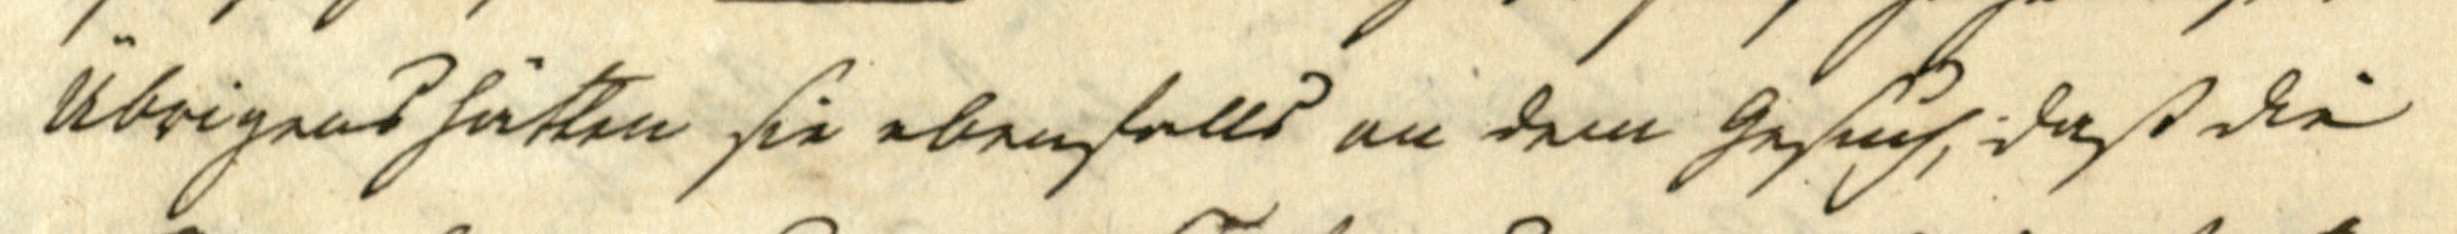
Übrigens hätten sie ebenfalls an dem Gesuch, daß die
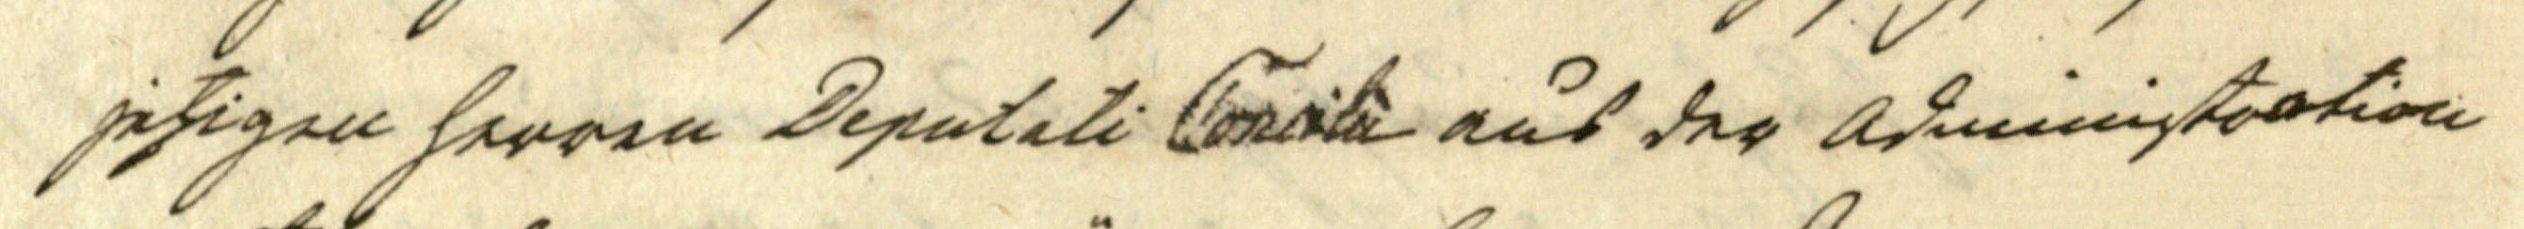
jetzigen Herren Deputati Concilii aus der Administration
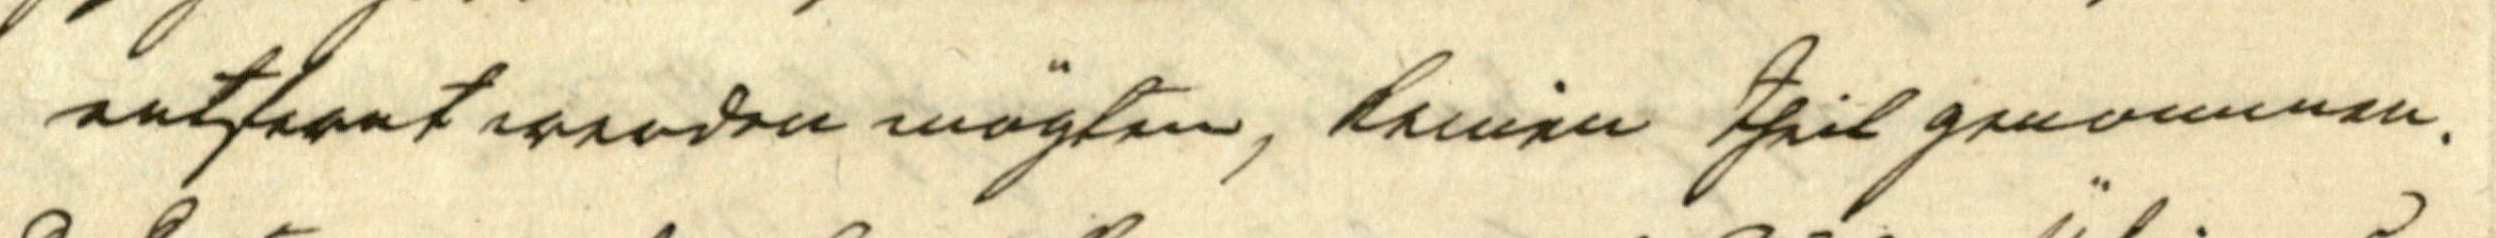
entfernt werden mögten, keinen Theil genommen.
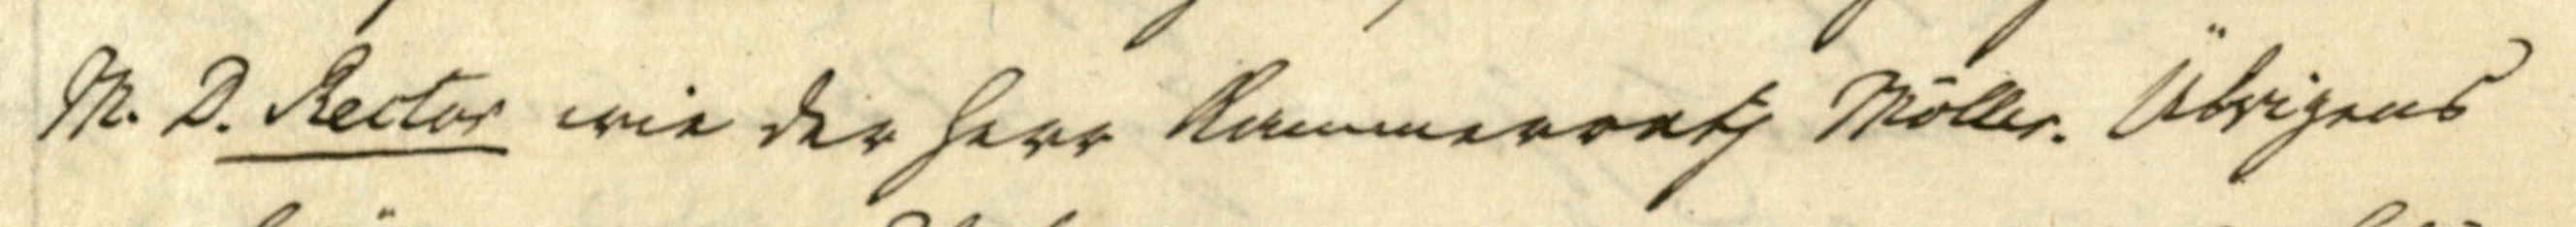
M. D. Rector wie der Herr Kammerrath Möller. Übrigens
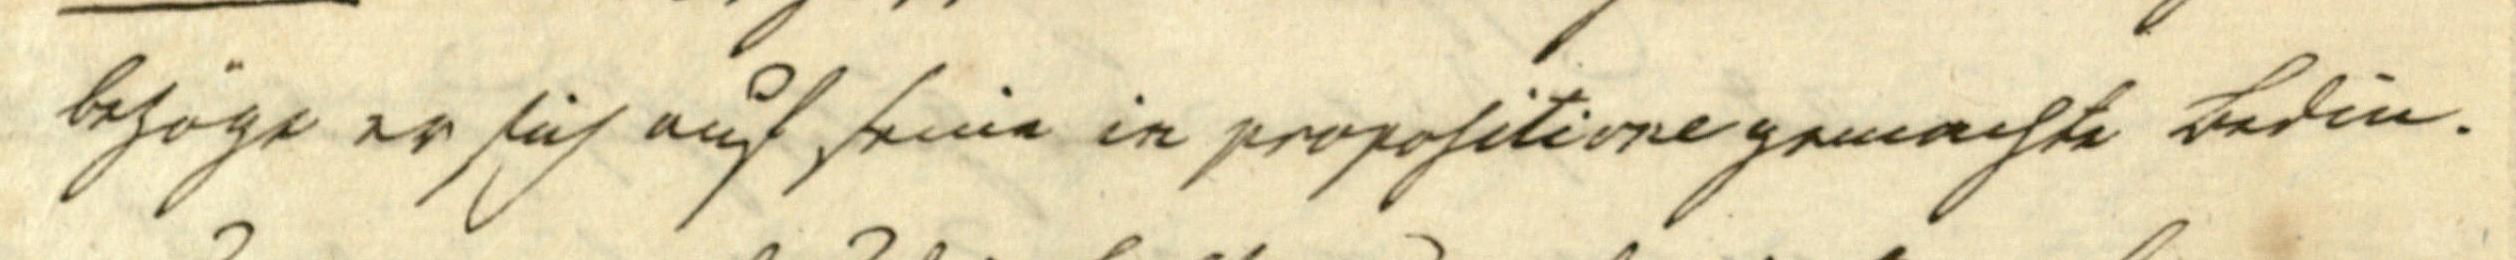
bezöge er sich auf seine in propositione gemachte Bedin¬
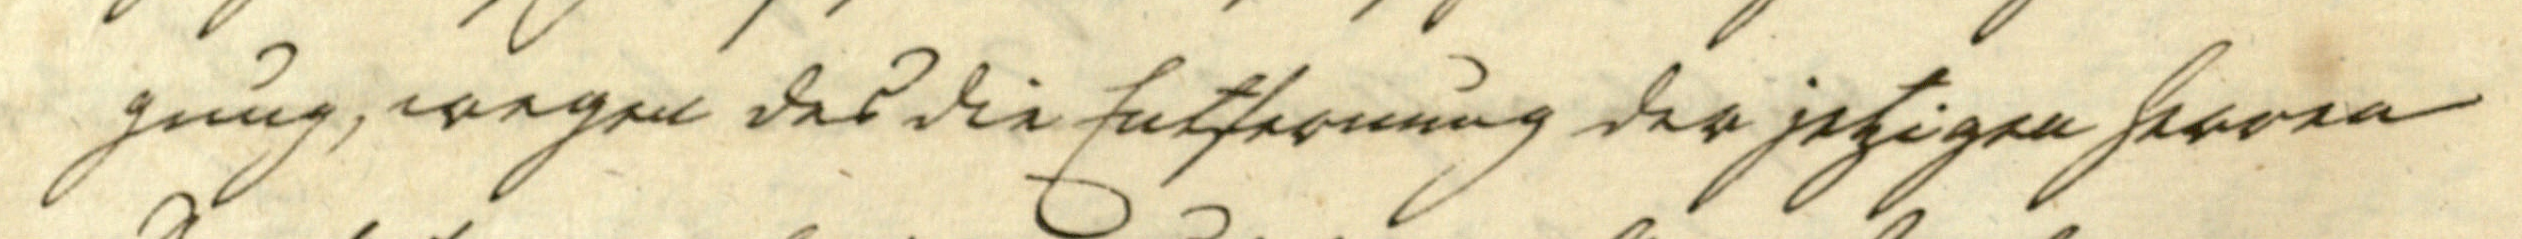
gung, wegen des die Entfernung der jetzigen Herren
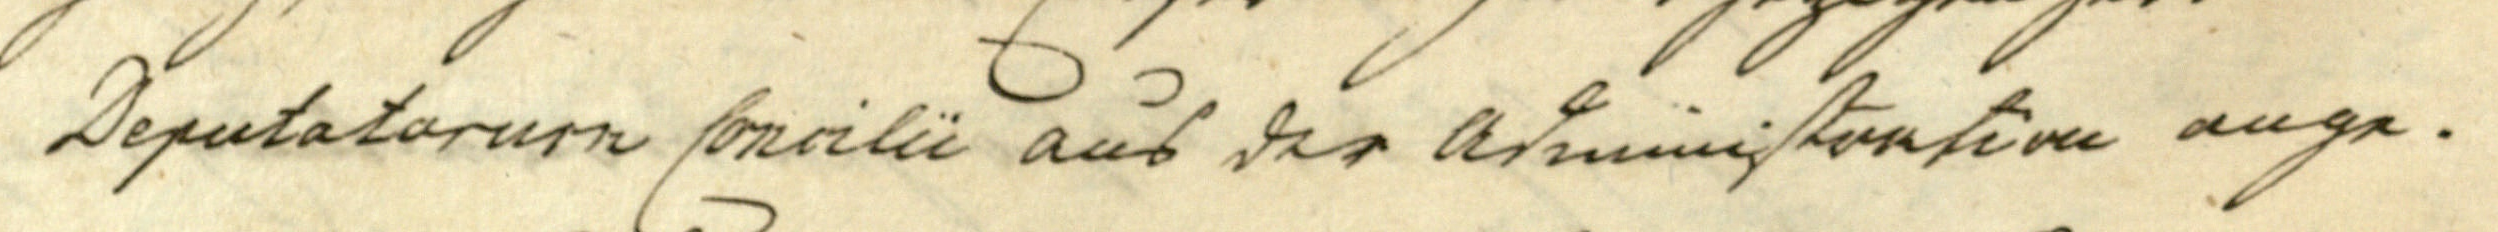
Deputatorum Concilii aus der Administration ange¬
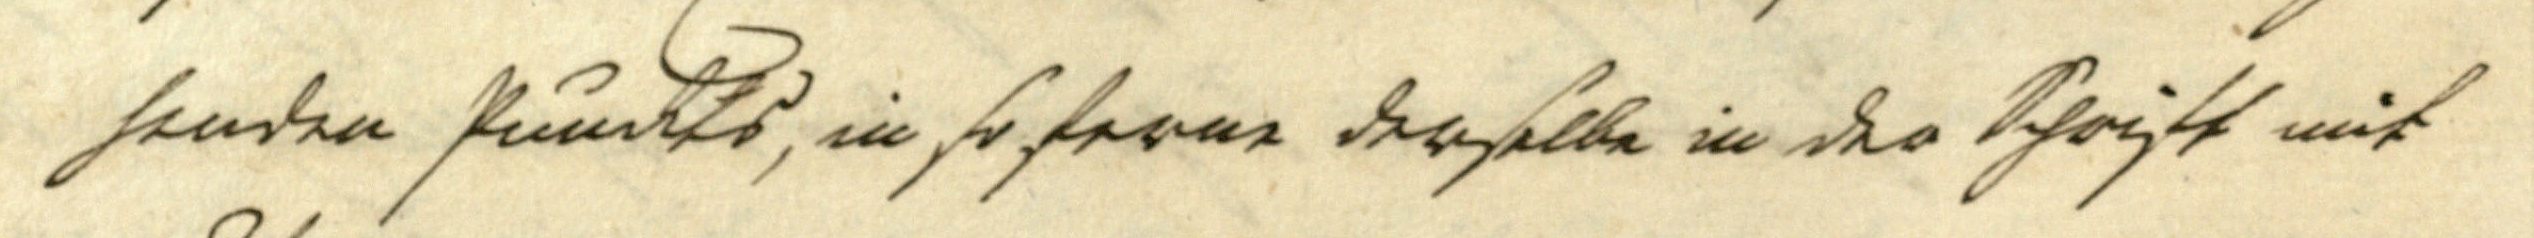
henden Punckts, in so ferne derselbe in der Schrift mit
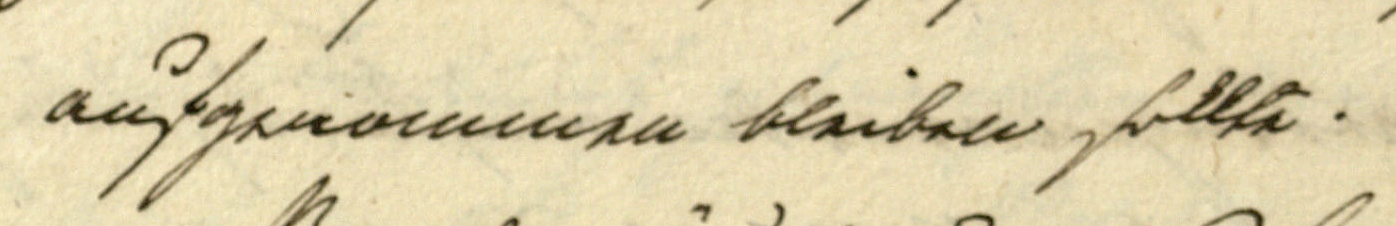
aufgenommen bleiben sollte.
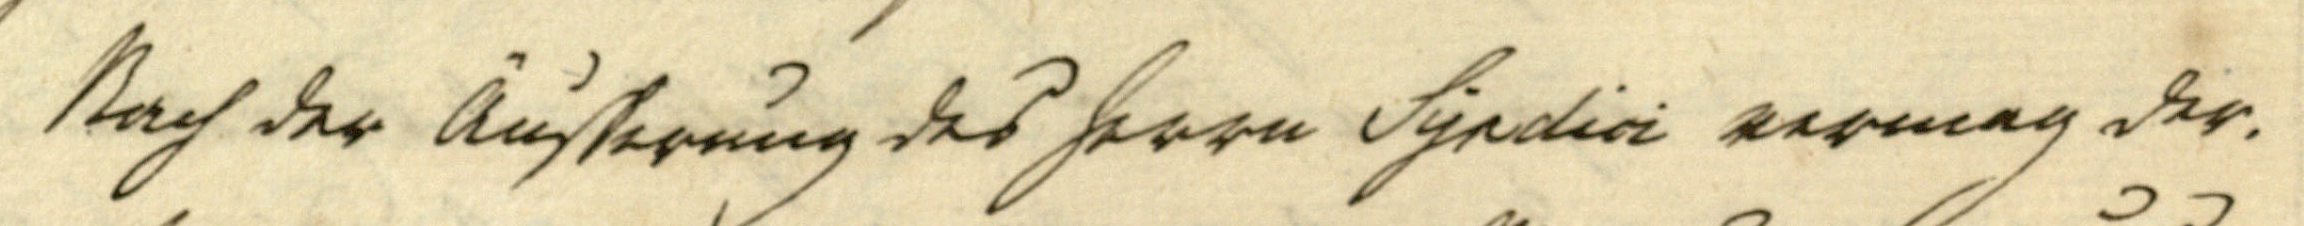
Nach der Äusserung des Herrn Sÿndici vermag der¬
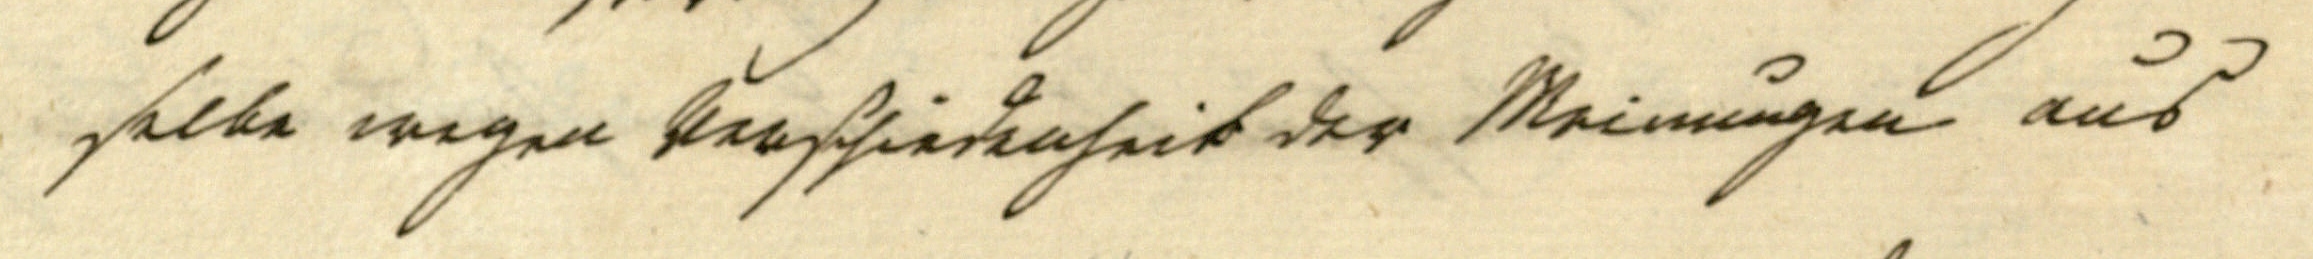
selbe wegen Verschiedenheit der Meinungen aus
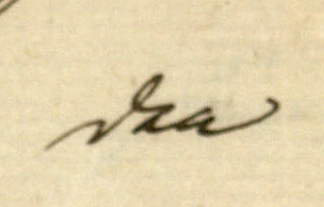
den
